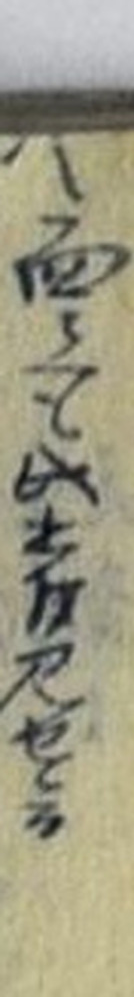之面々へも此書付見せ候而
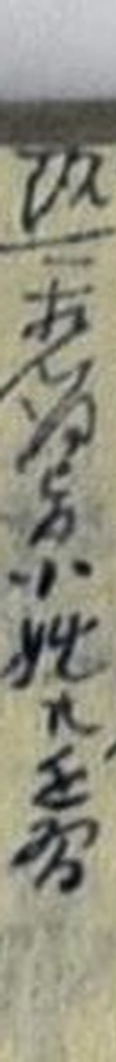趣可相心得旨小姓共近習
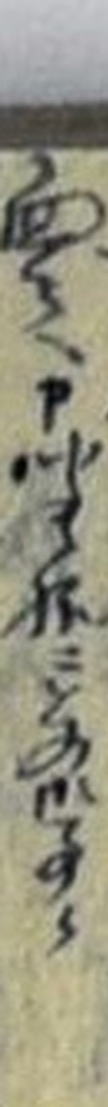面々へ申聞候様ニとの御事ニ
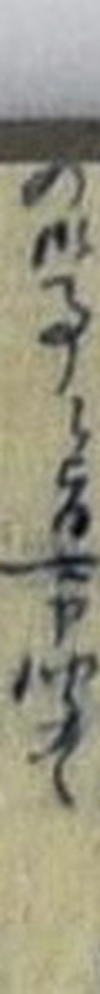の御事候旨可申聞候
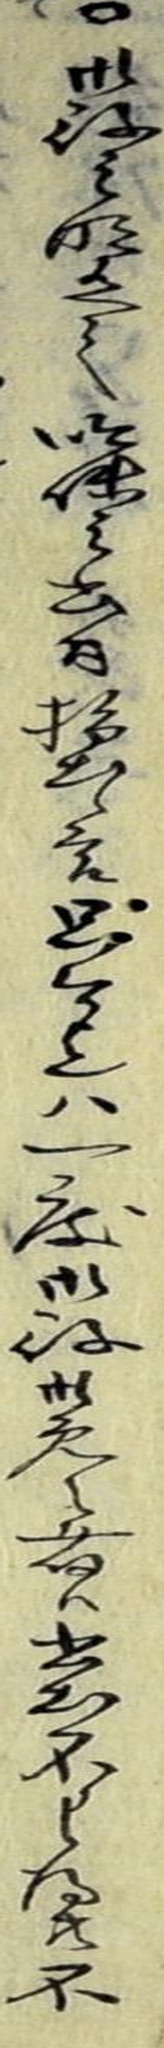〇御役之明有之吟味之書付指出候節只今迄ハ一度御役御免之者ハ書出不申候得共不
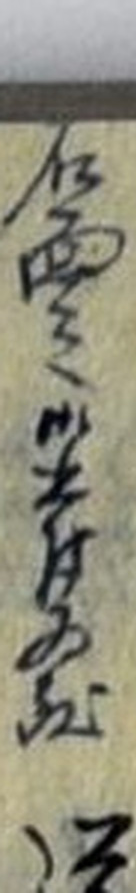右面々へ御書付為致
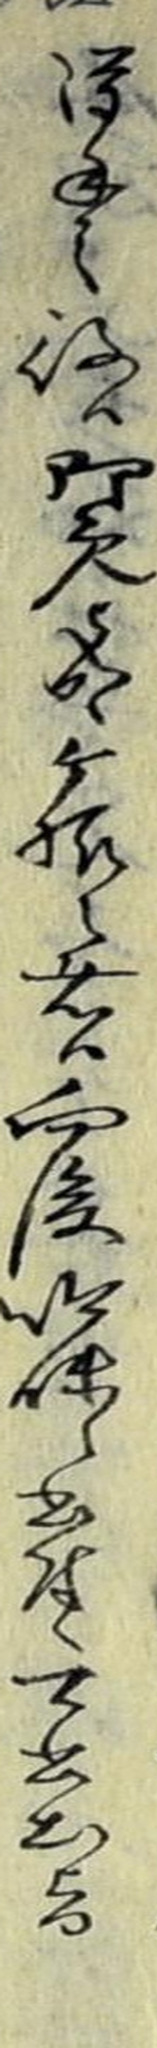得手之役ハ御免被成候ケ様之者ハ向後吟味之書付へ可出旨
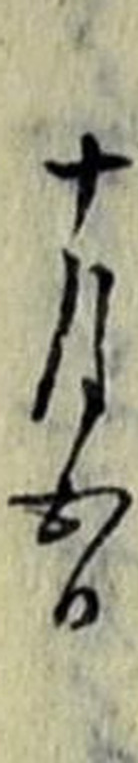十月五日
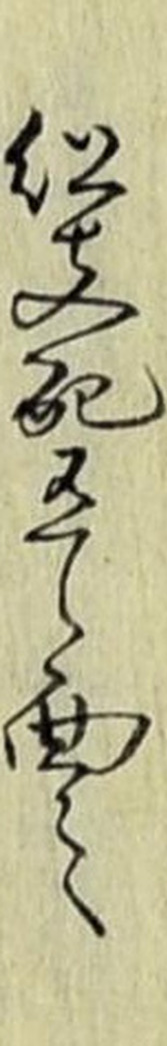役支配有之面々へ
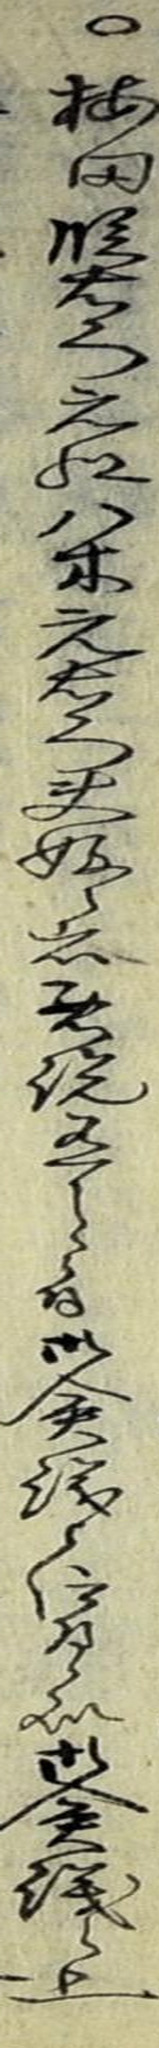〇梅田段右衛門元組八木元右衛門夫婦之者悪説有之候ニ付御僉議被仰付候処御僉議之上
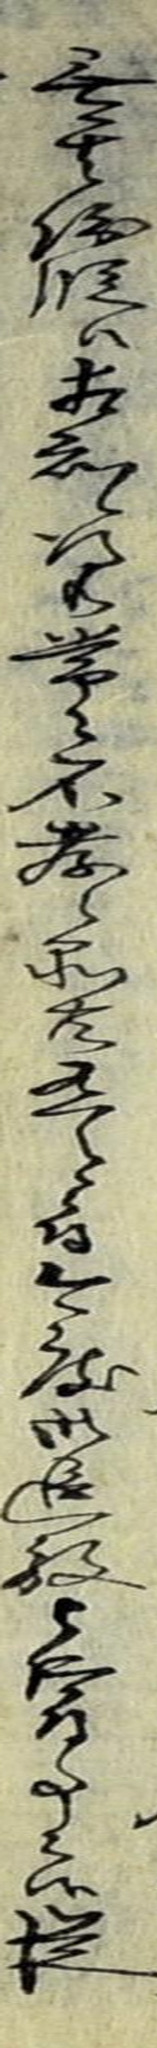無其儀段ハ相知候得共常々不孝之品共有之候ニ付今度御追放被仰付事ニ候従
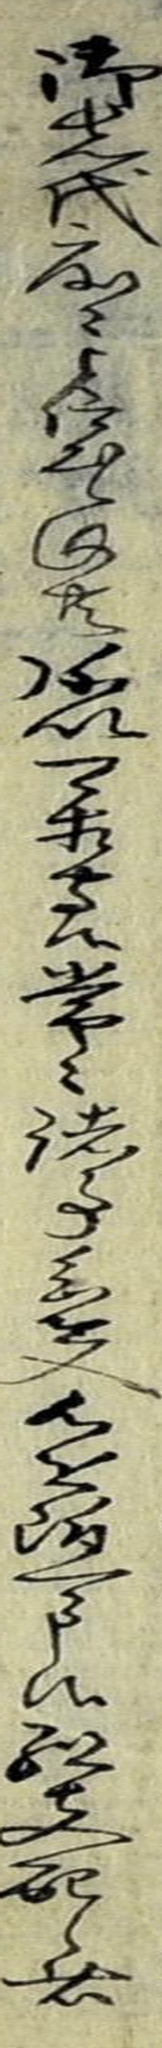御先代度々被仰出候趣共弥以可相守候常々諸事念を入心を附可申候組支配之者
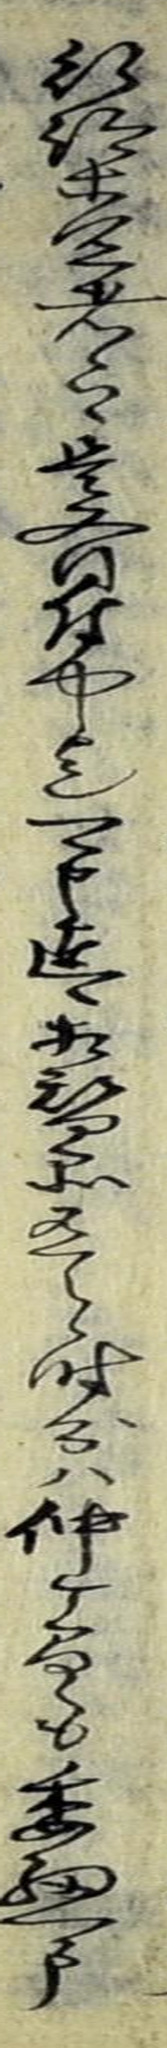行跡等宜者候ハヽ是又目付中迄可申達候相替品有之候時分ハ仲ケ間へも委細可申
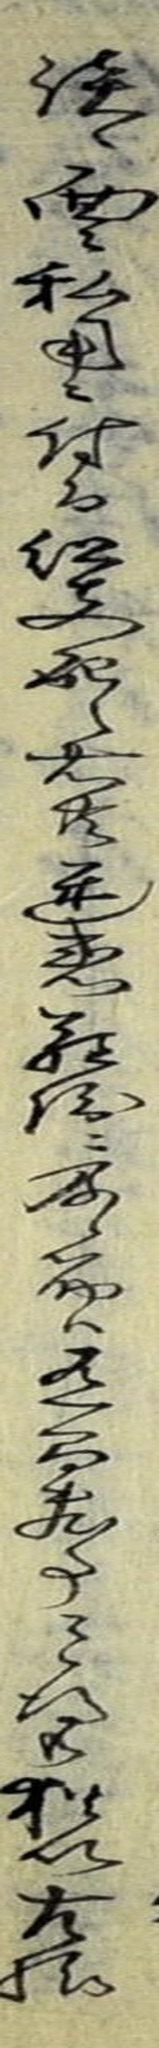談候面々私用ニ付而組支配之者共迷惑難儀ニ及候筋ハ有間敷事ニ候得共猶以左様
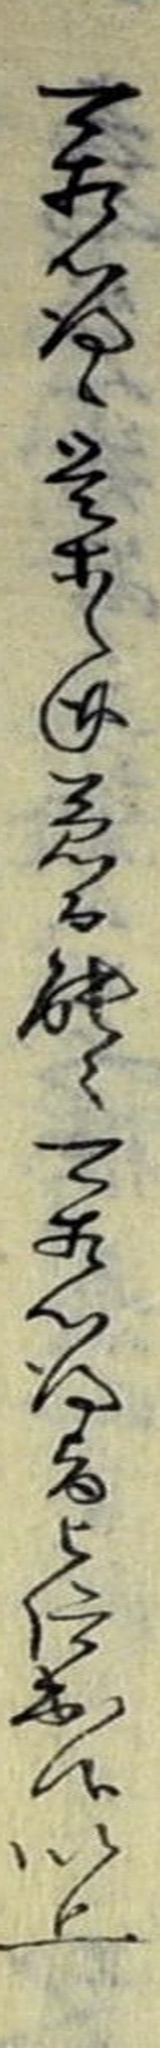可相心得候是等之趣兼而能々可相心得旨被仰出候以上
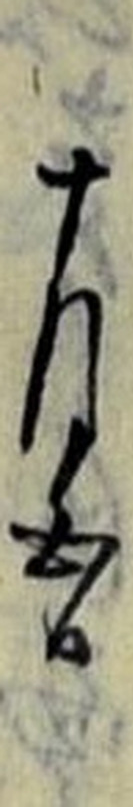十月五日
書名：命令之部 一
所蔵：福井県文書館 Fukui Prefectural Archives
